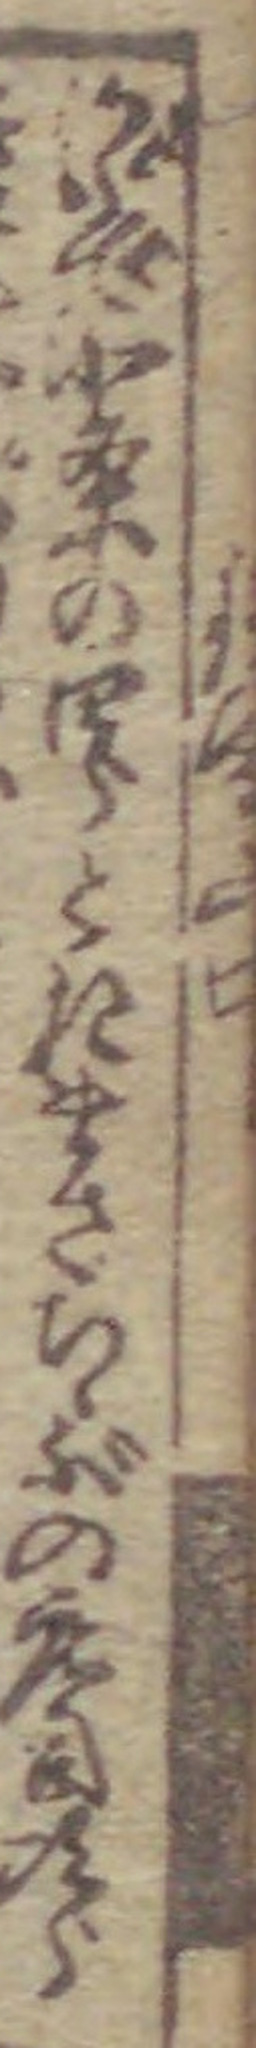かくて北条の四郎ときまさちゝぶの庄司次郎
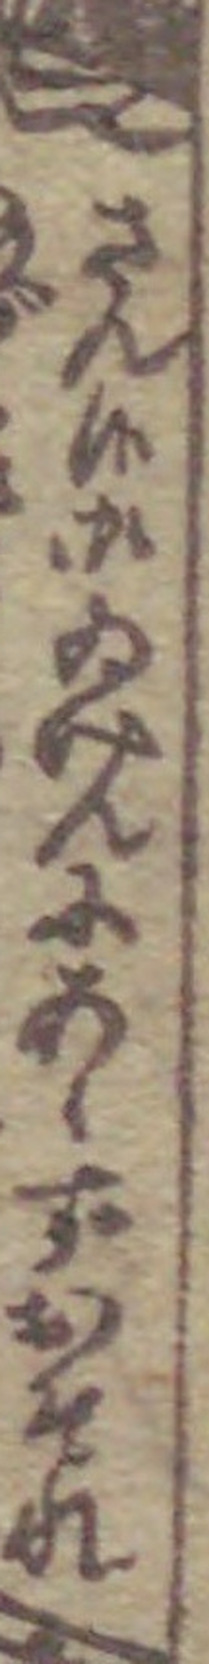さん候御いゐけんにあらずおそれ
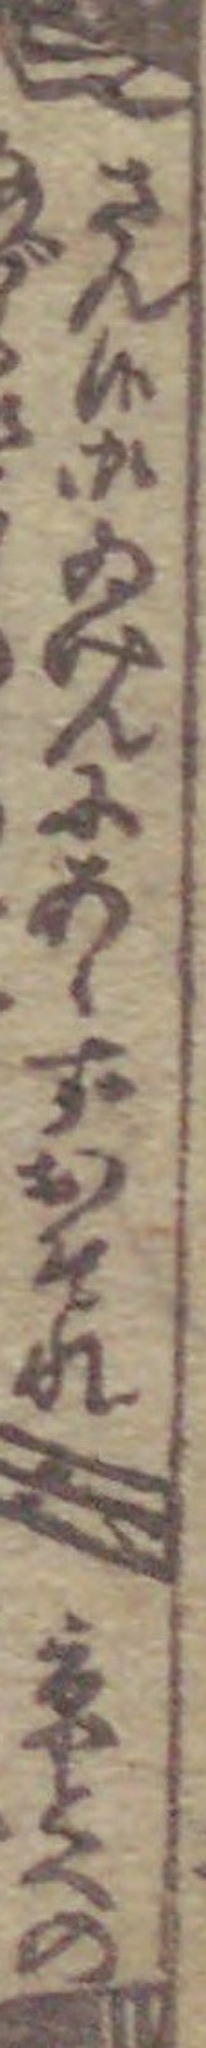さん候御いゐけんにあらずおそれ
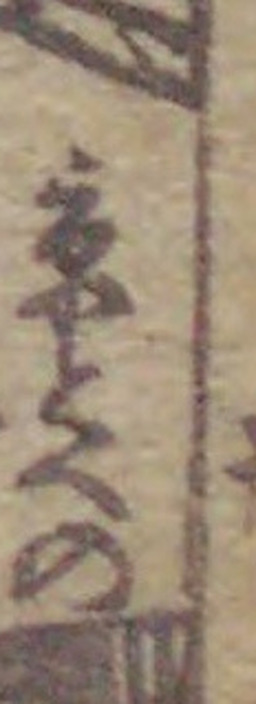京とへの
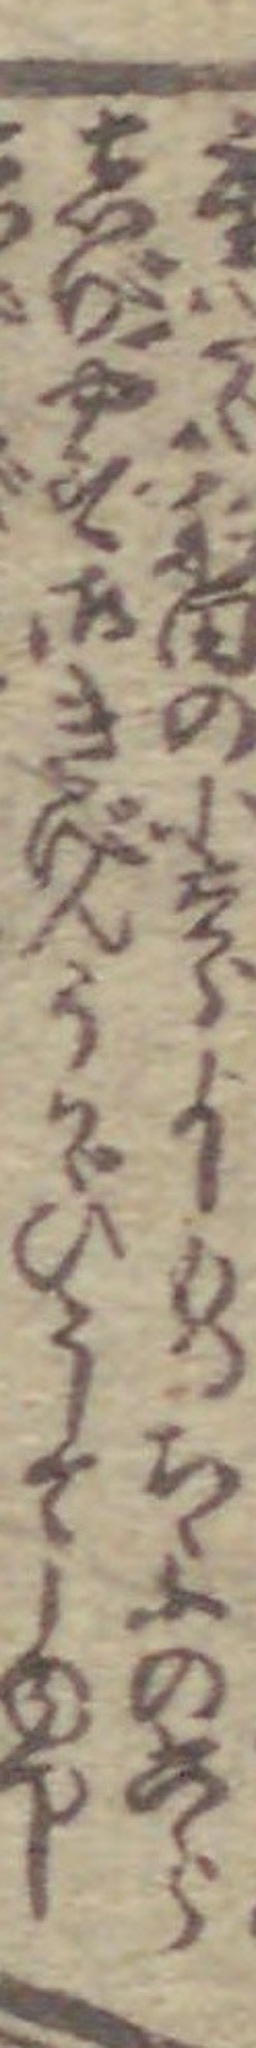しげやす御きげんうかゞひとしてしゆつし
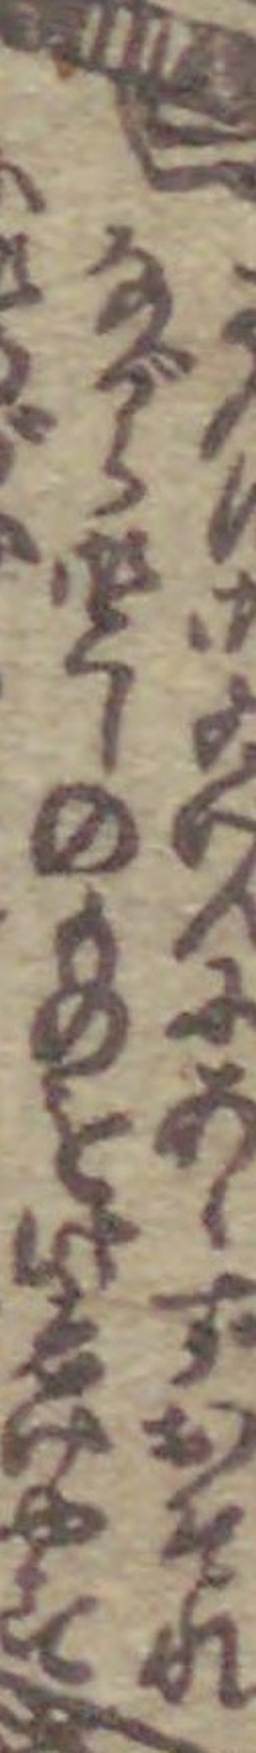ながら御こしのものを此しけやす
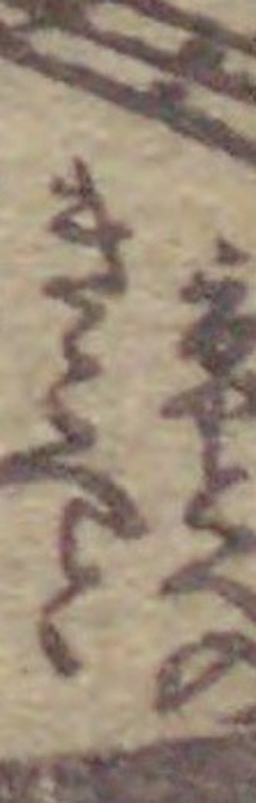きこへと
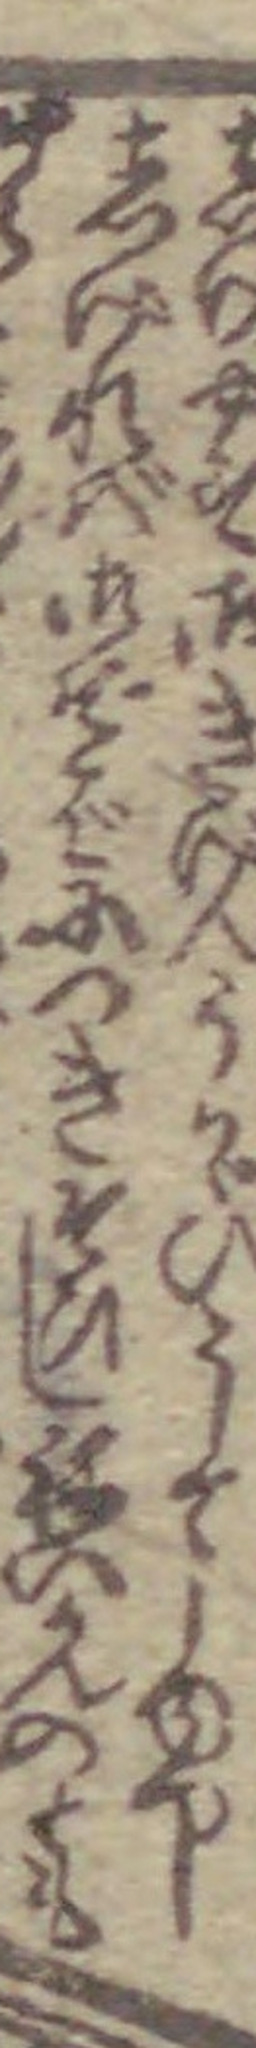しければ御そばにつきそひしねいかんのとも
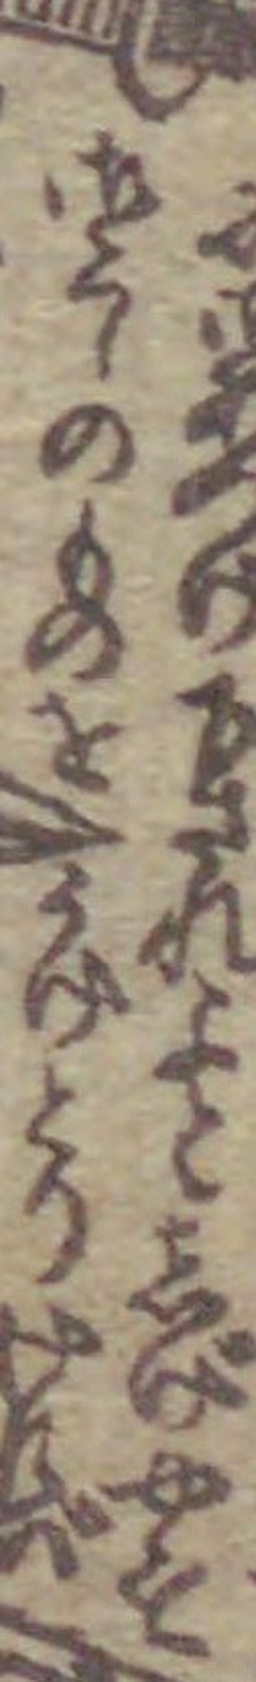御こしのものをうけとりければ
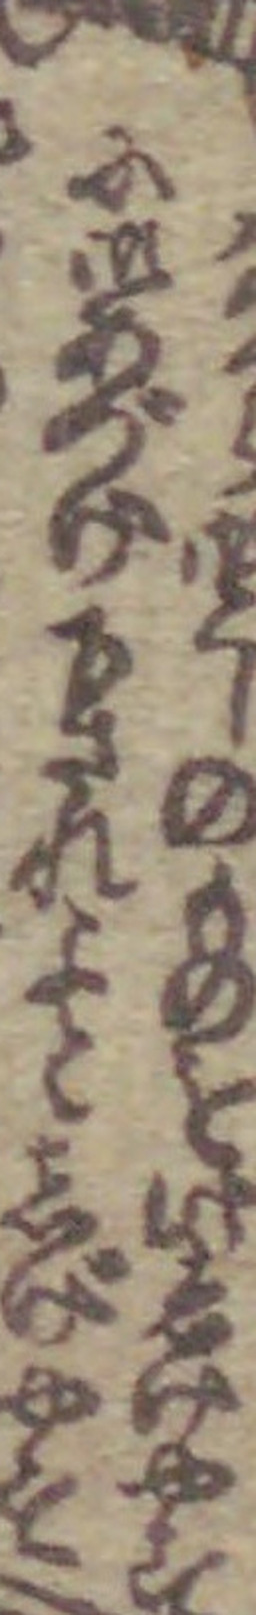に御あづけ下されよとしげやす
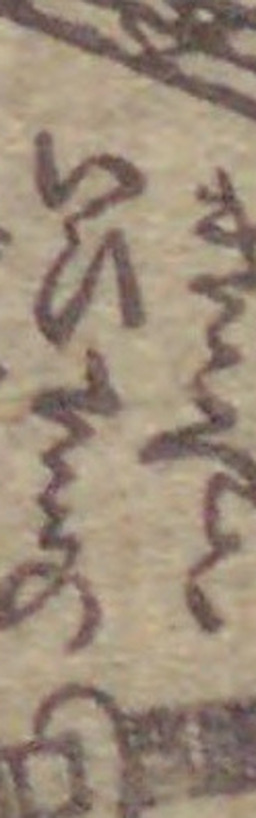いひたみの
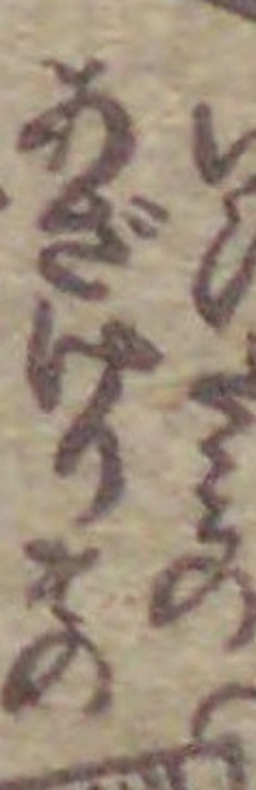あざけりその
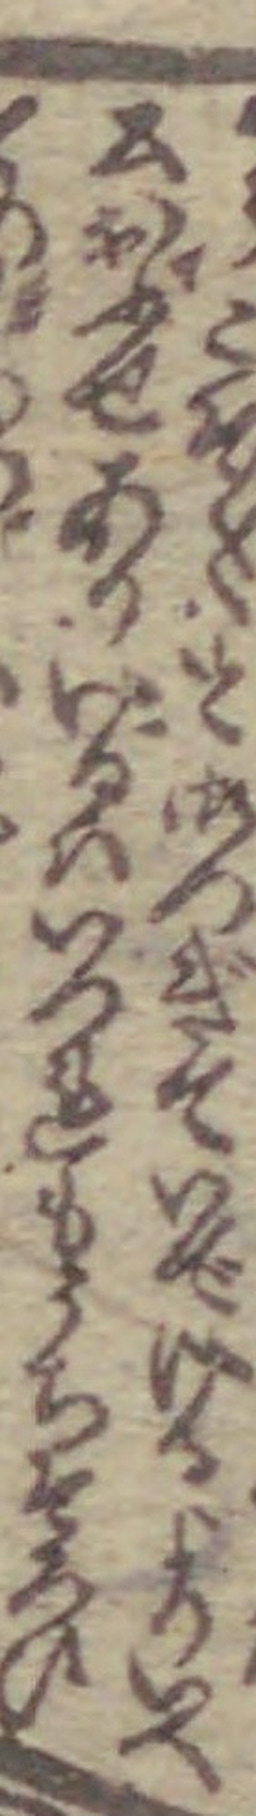公おふせありけるはいつれもうちそろひ
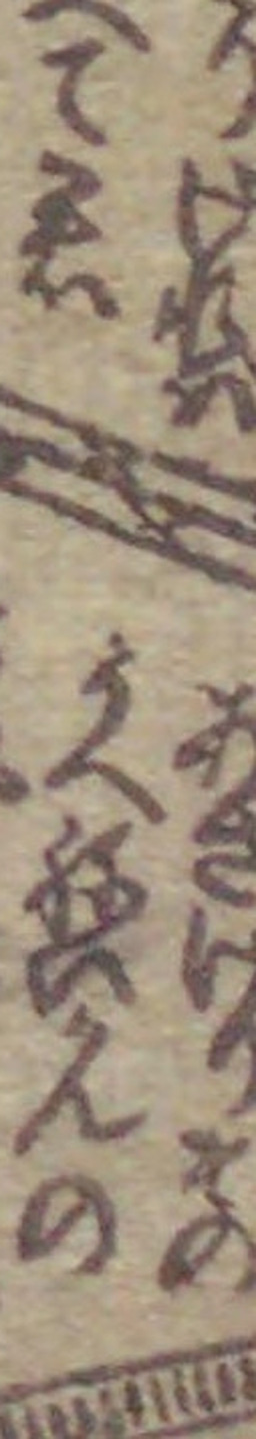うへねいかんの
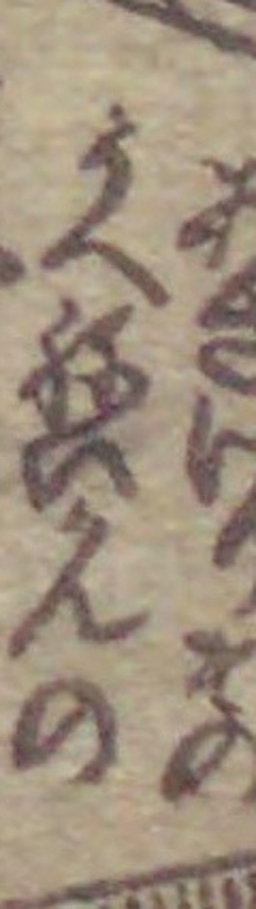うへねいかんの
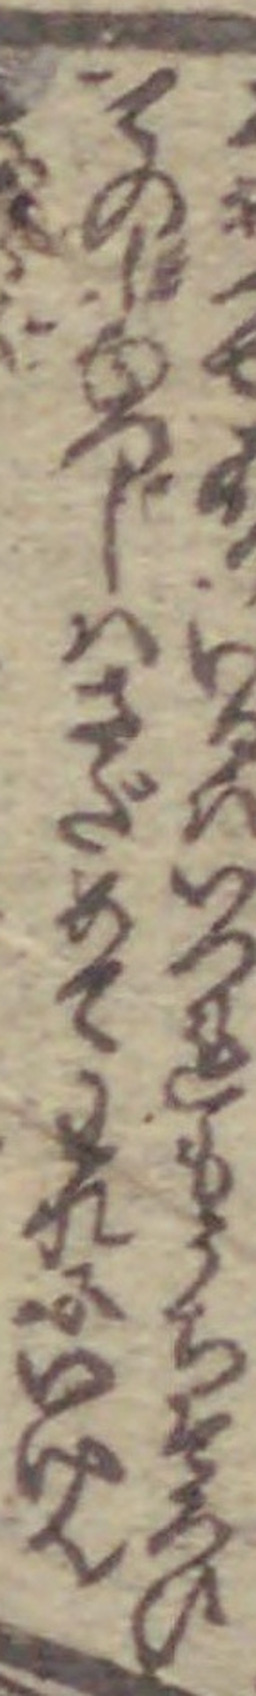てのしゆつしはさだめてわれにいけん
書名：鎌倉山紅葉浮名
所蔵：国立国会図書館 National Diet Library, JAPAN
